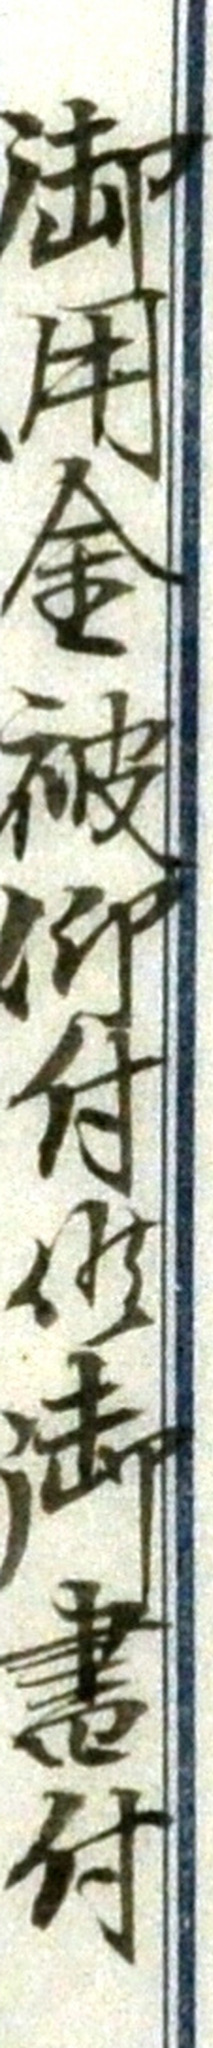御用金被仰付候御書付
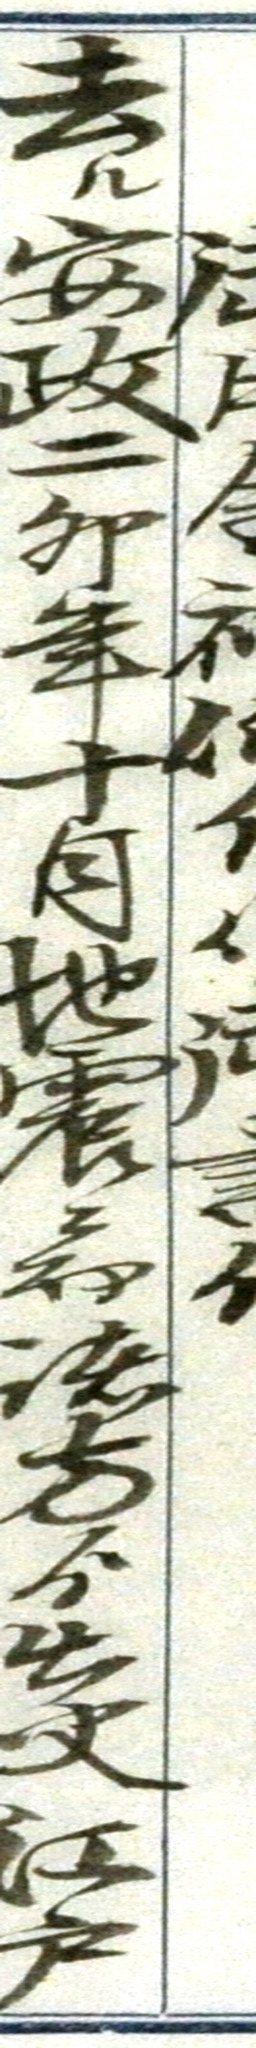去ル安政二卯年十月地震ニ而諸方ゟ出火江戸
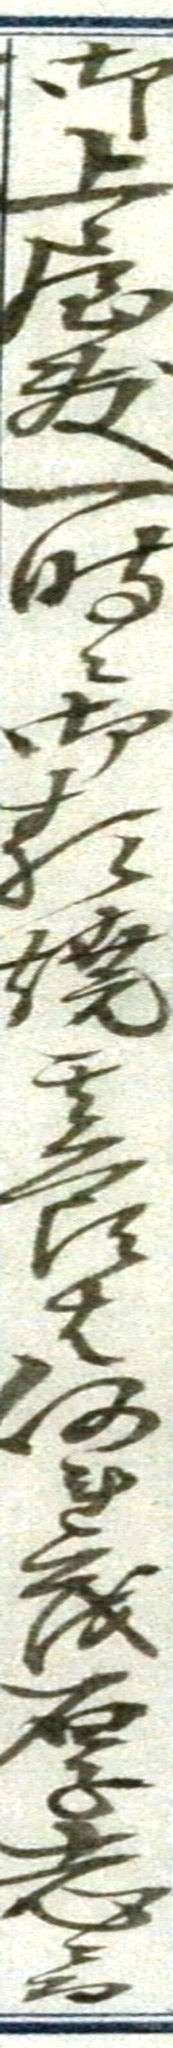御上屋敷一時ニ御類焼其節者何連も厚志ニ而
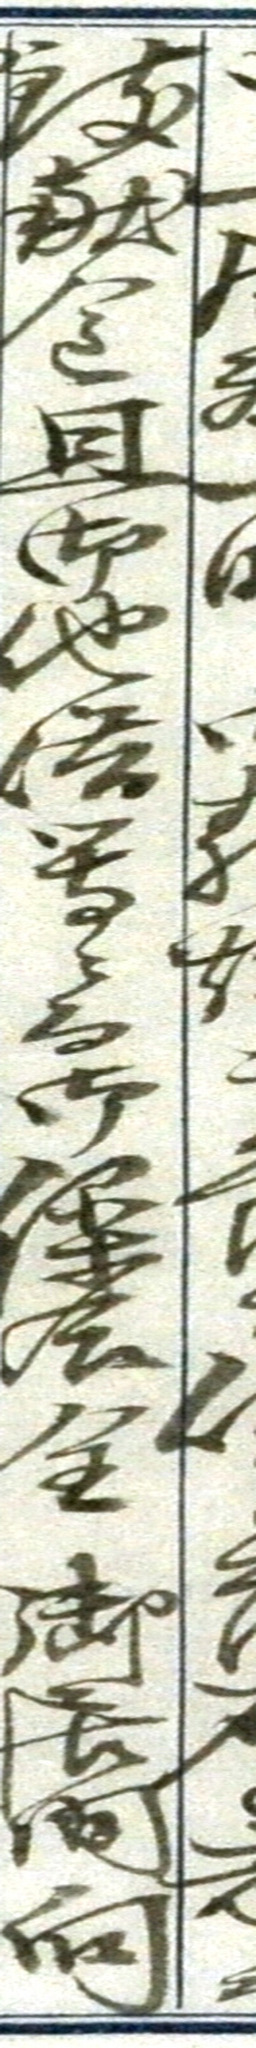致献金且御他借等ニ而御繰合全御居間向
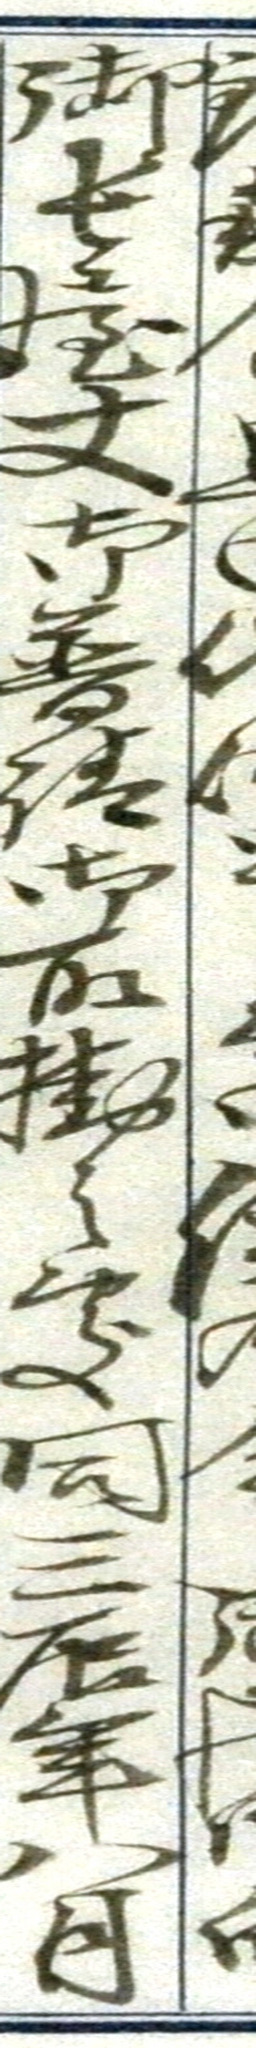御長屋丈御普請取掛之処同三辰年八月
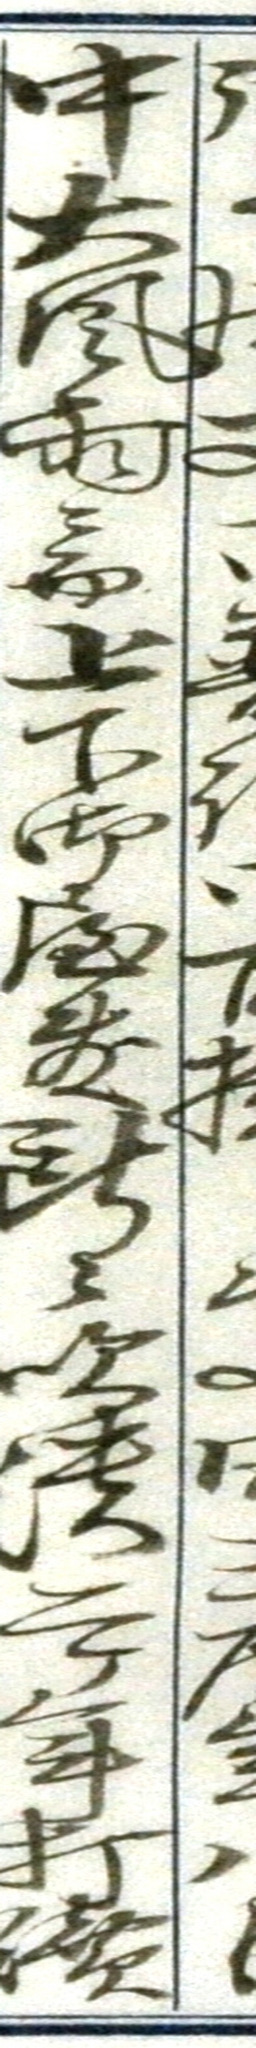中大風雨ニ而上下御屋敷所々吹潰ニケ年打続
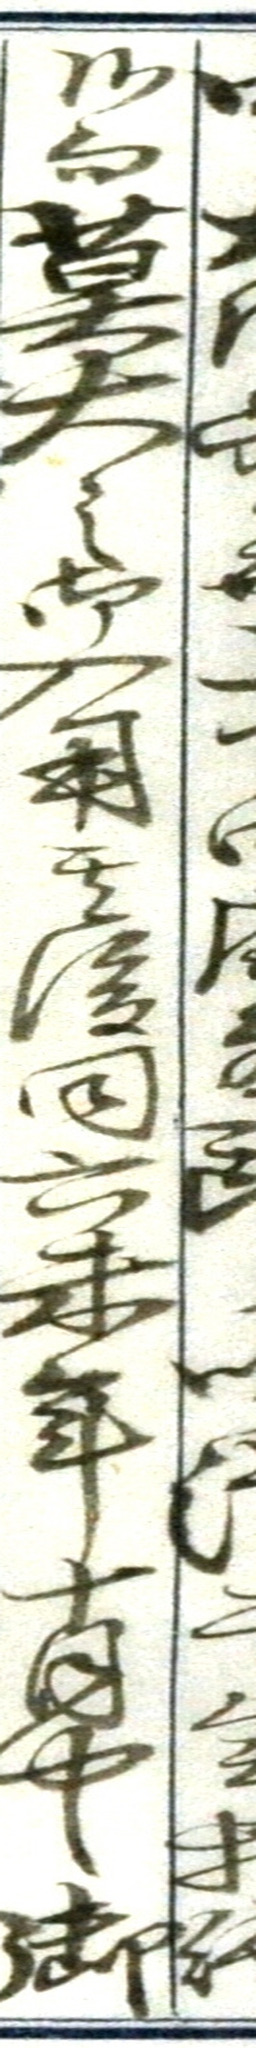候而莫大之御入用其後同六未年十月中御
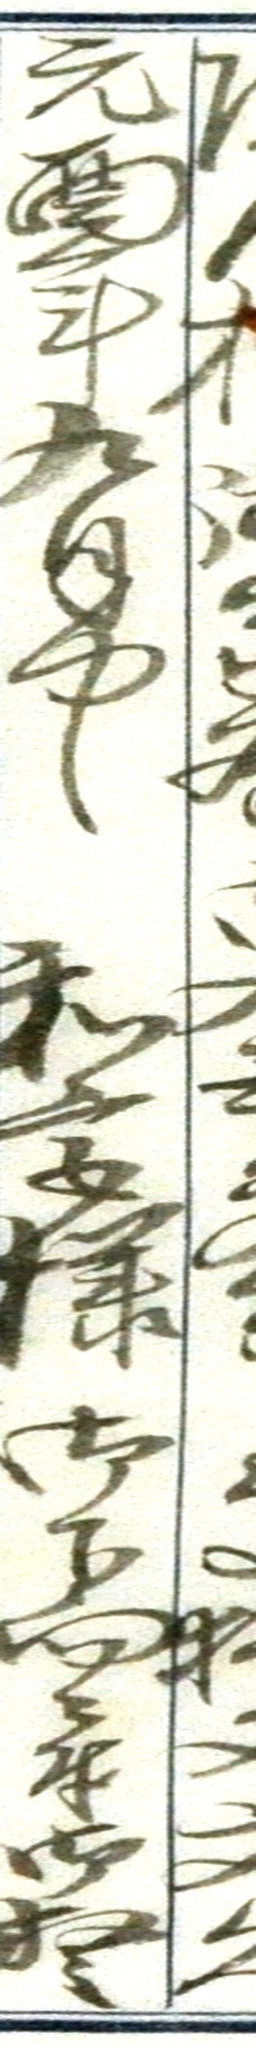元酉年九月中和宮様御下向ニ付御警
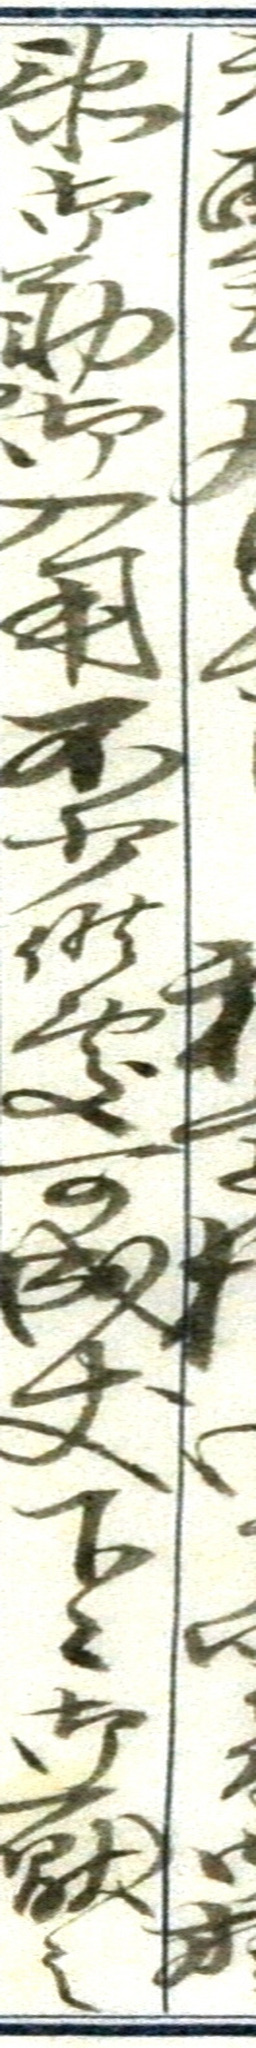衛御勤御入用不少候処可成丈下々御厭之
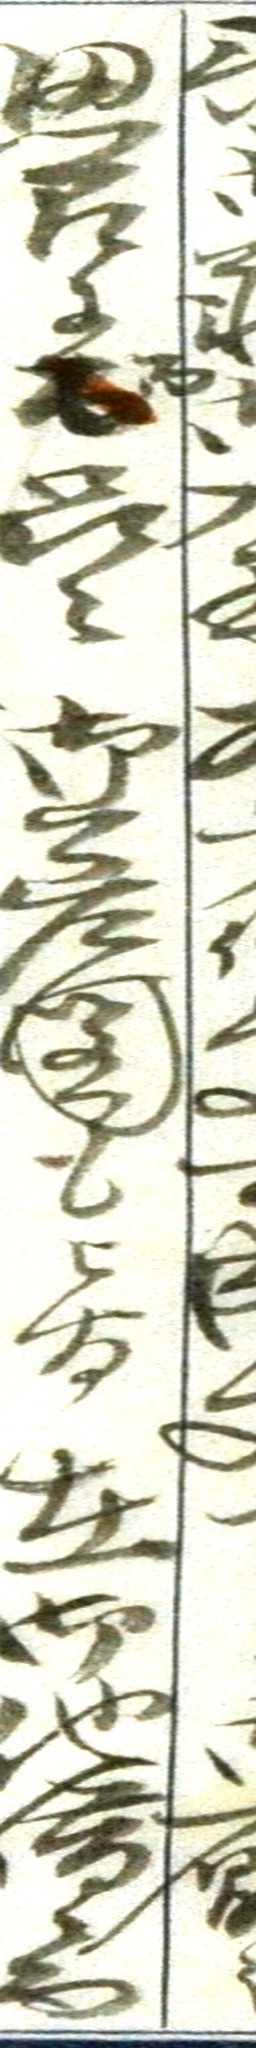思召に而品々御差図も被為在御他借ニ而
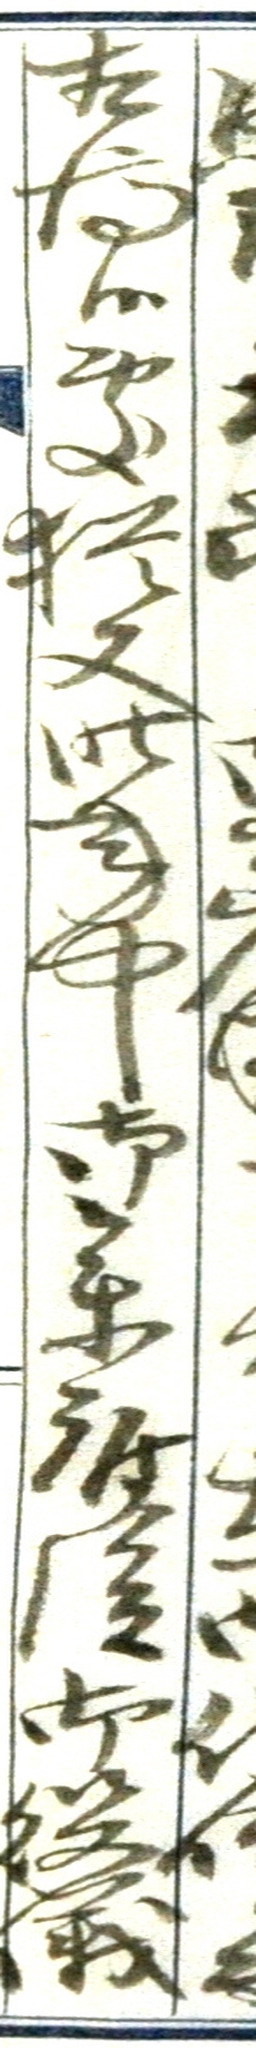相済候処猶又昨年中御参府後御役儀

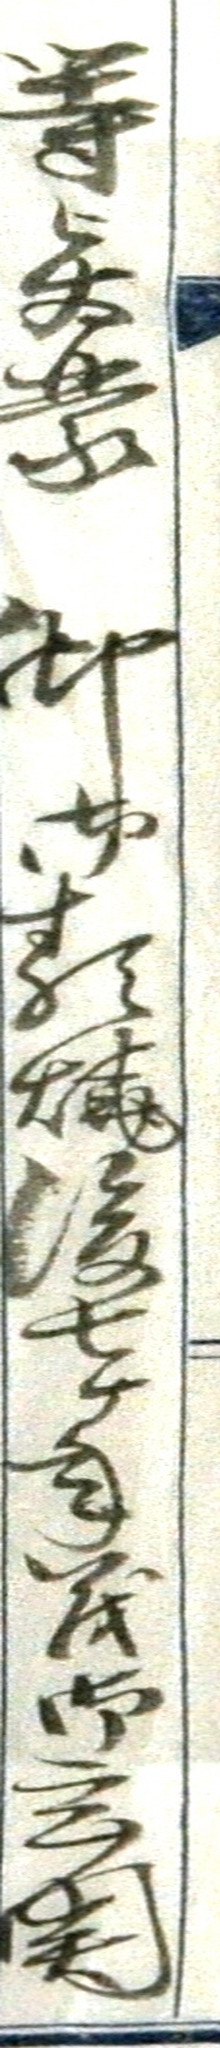等被為蒙仰御類焼後七ヶ年も御玄関
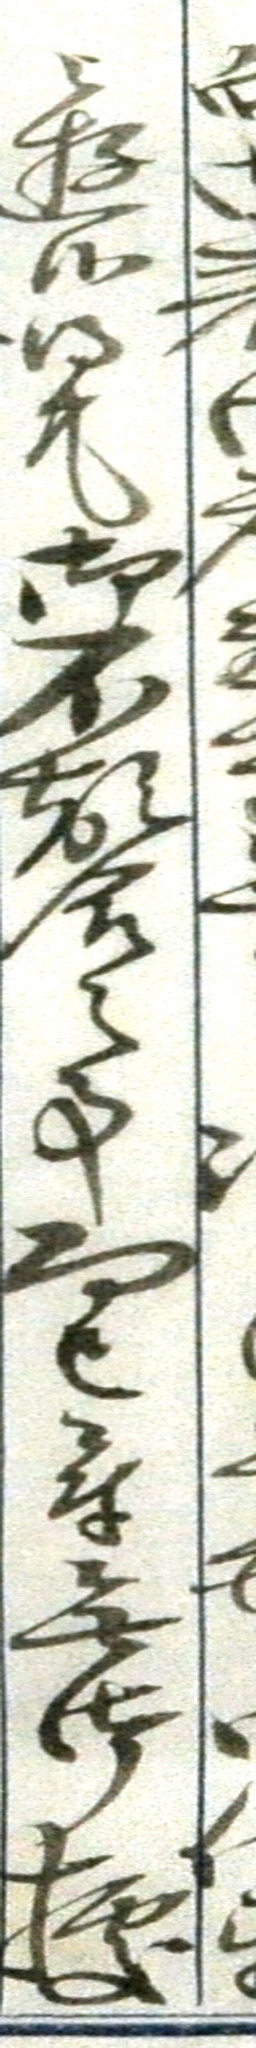被遊候得共御不都合之事而巳二付無御拠
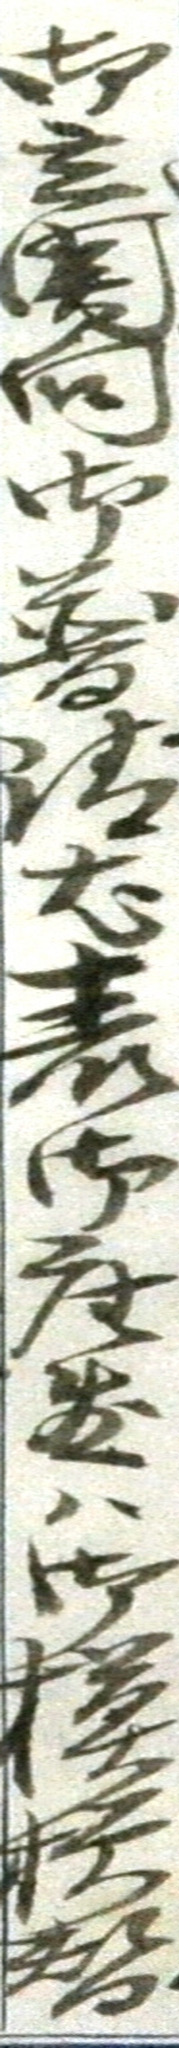御玄関向御普請尤表御座敷ハ御模様替
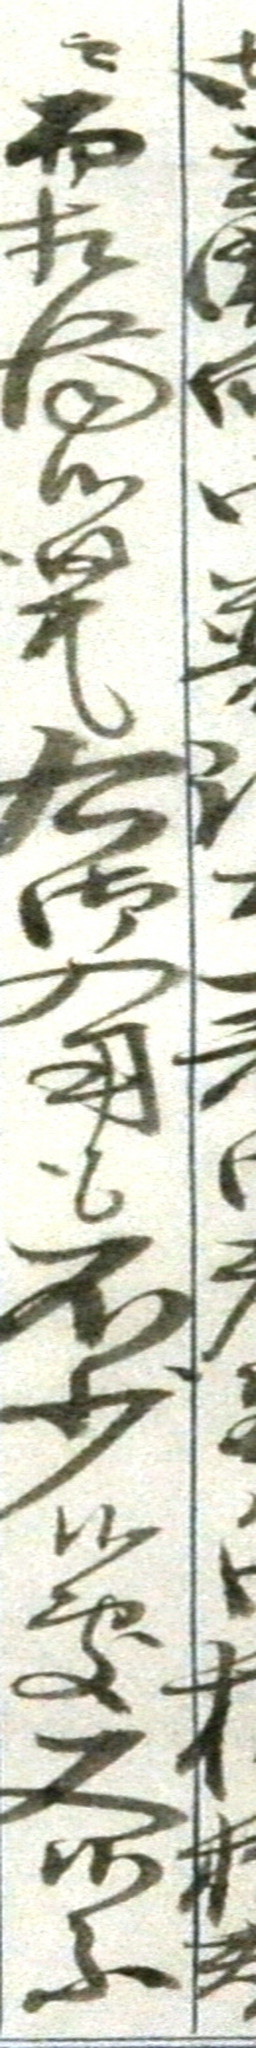ニ而相済候得共右御入用も不少候処又候不
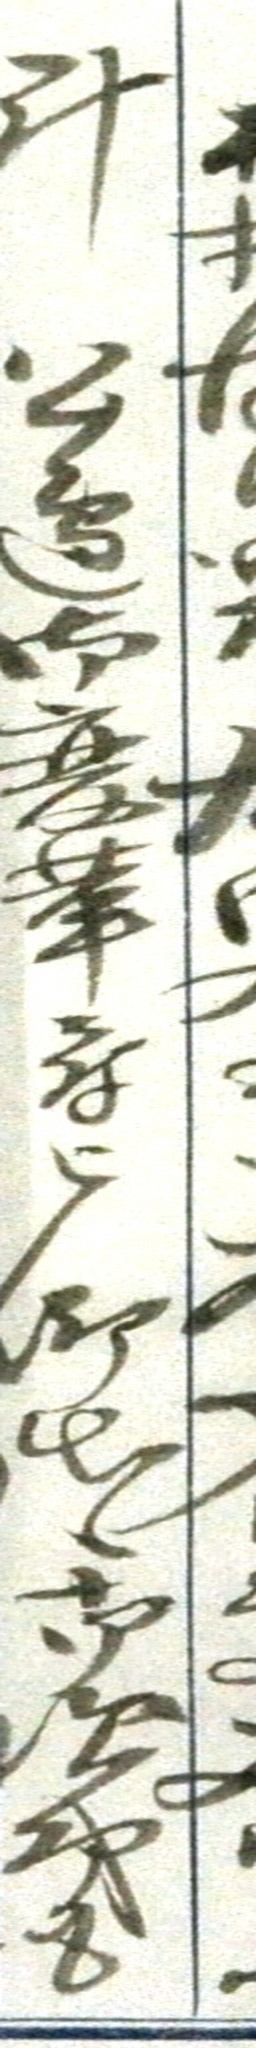計公辺御変革ニ付被仰出候御次第も
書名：御用金被仰付候御書付
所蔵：伊那市立高遠町図書館・合同会社AMANE
